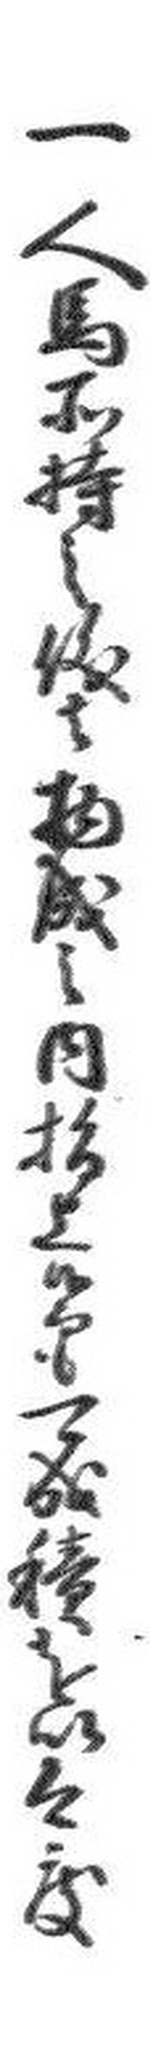一人馬所持之儀者物成之内指上候而も可成積を以今度
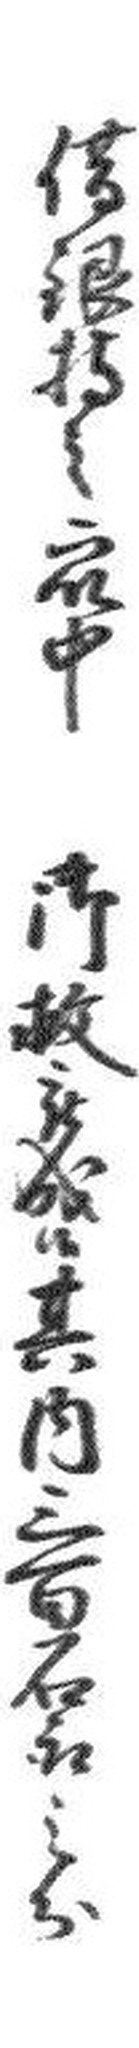借銀持之衆中御救被成候其内三百石取之分
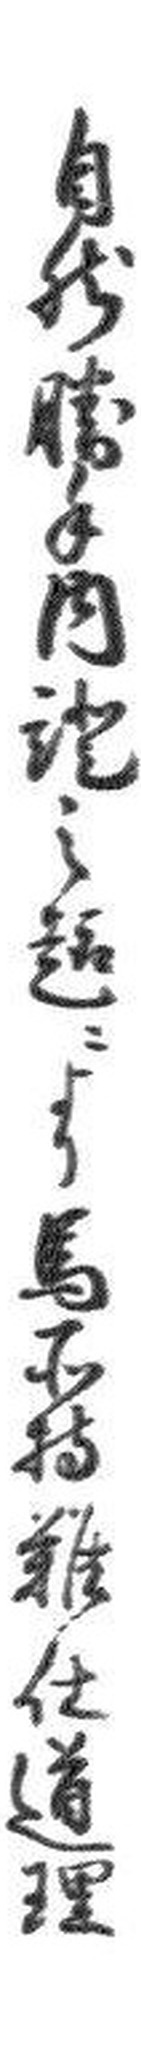自然勝手内証之趣ニより馬所持難仕道理
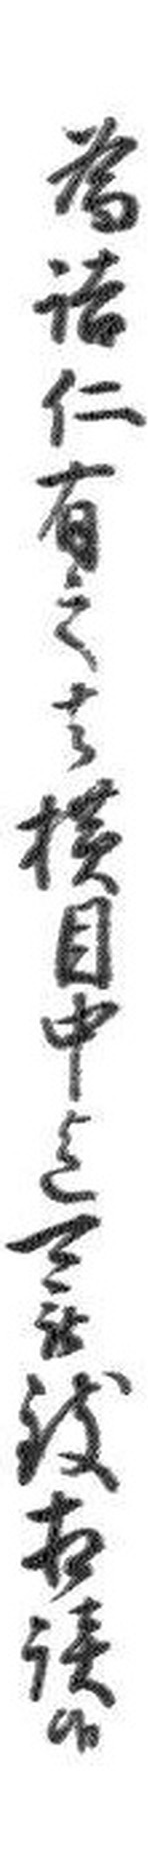為詰仁有之者横目中迄可被致相談候
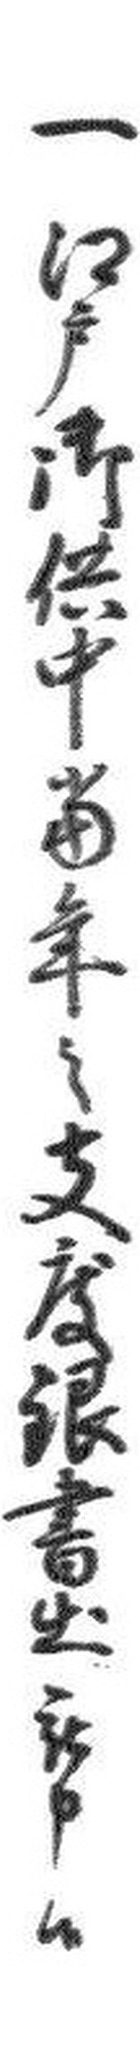一江戸御供中当年之支度銀書出被申候

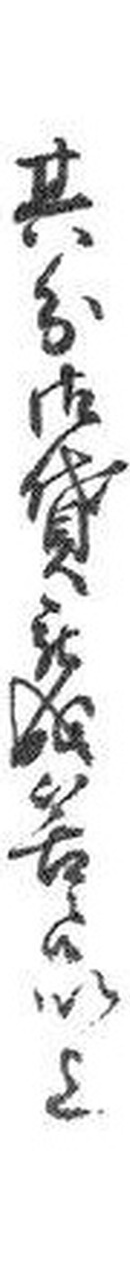其分御貸被成筈ニ候以上
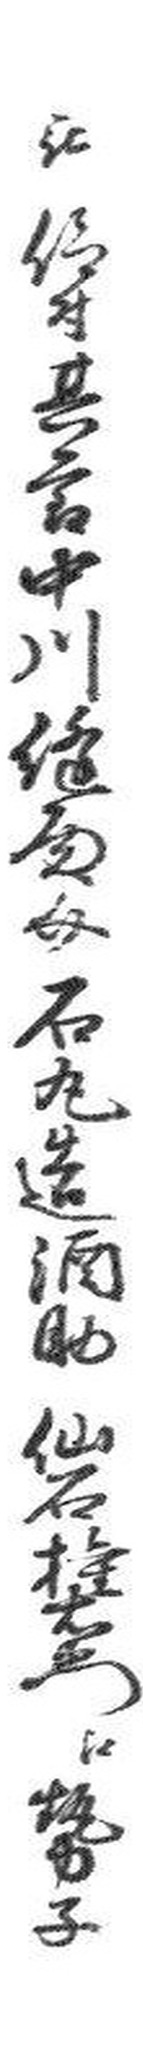被仰付其節中川縫殿介石丸造酒助仙石権右衛門江勢子
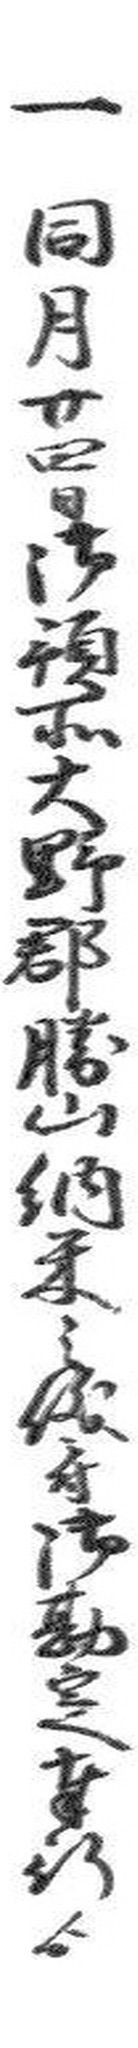一同月廿四日御預所大野郡勝山納米之儀ニ付御勘定奉行ゟ
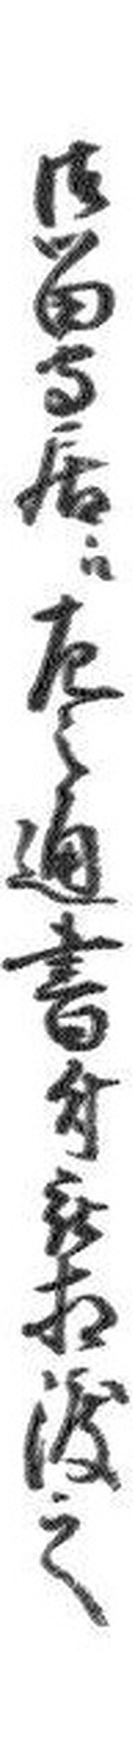御留守居江左之通書付被相渡之
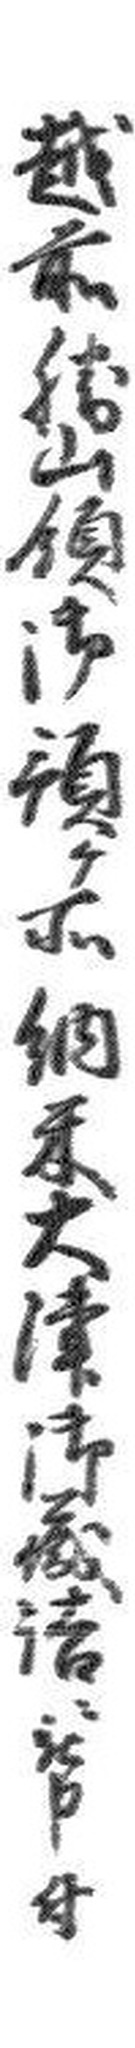越前勝山領御預ケ所納米大津御蔵詰ニ被申付
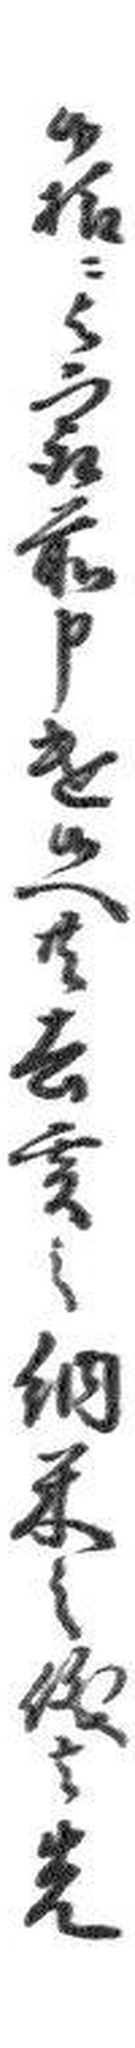候様ニと最前申遣候へ共去亥之納米之儀者先
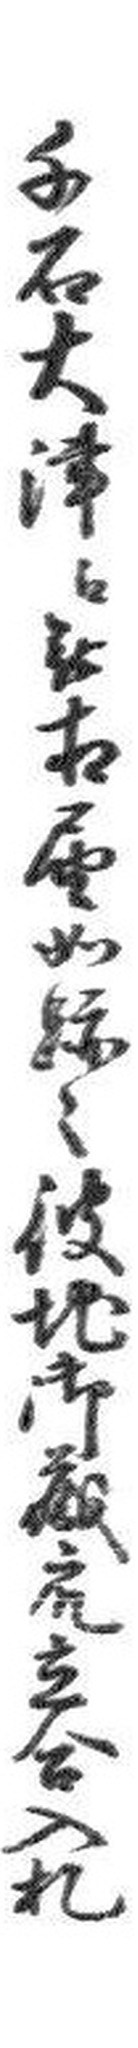千石大津江被相届如跡々彼地御蔵衆立合入札
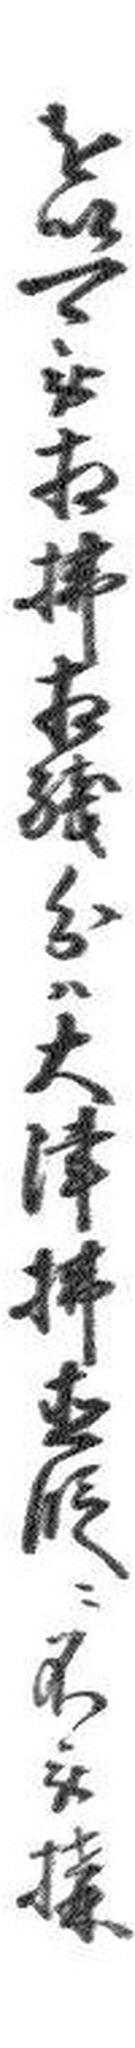を以可被相払相残分は大津払直段ニ不被構
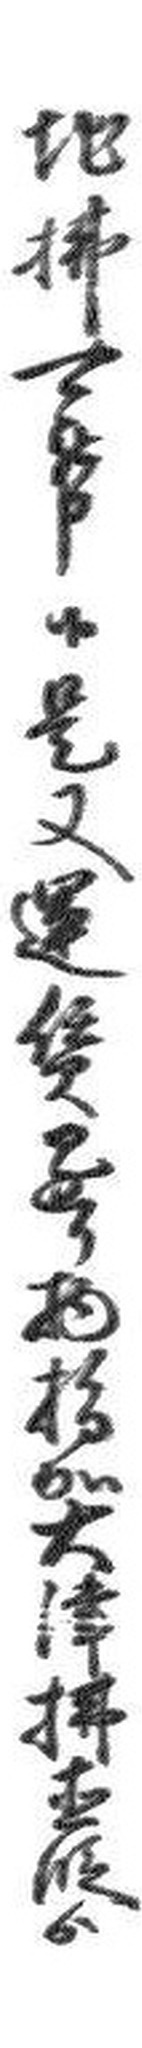地払可被申候是又運賃懸り物指加大津払直段ゟ

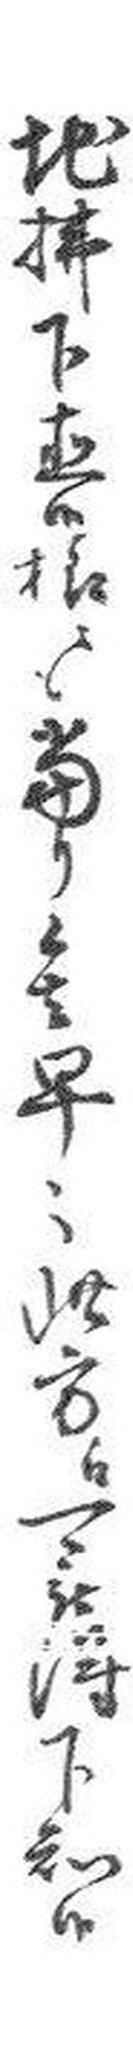地払下直候様ニも当り候者早々此方江可被得下知候
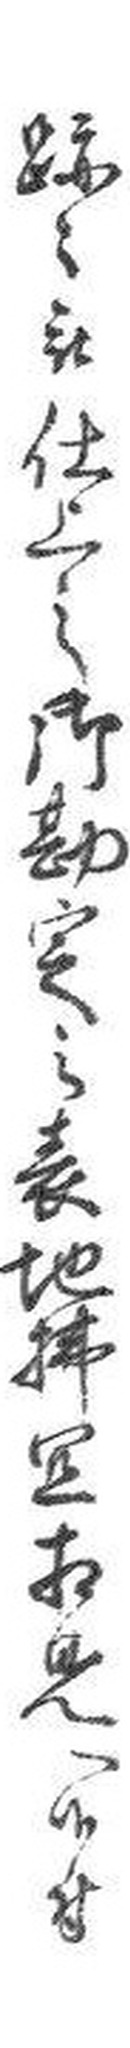跡々被仕上之御勘定之表地払宜相見へ候ニ付
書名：家譜 八 光通公 従寛文十年到同十二年
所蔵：福井県文書館 Fukui Prefectural Archives
